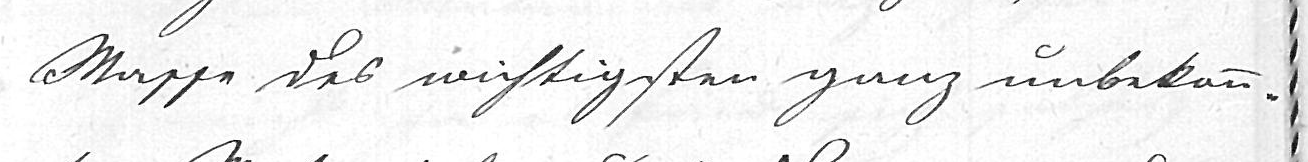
Masse des wichtigsten ganz unbekan-
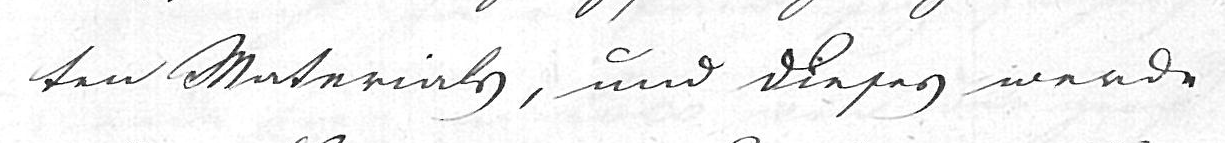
ten Materials, und dieses werde
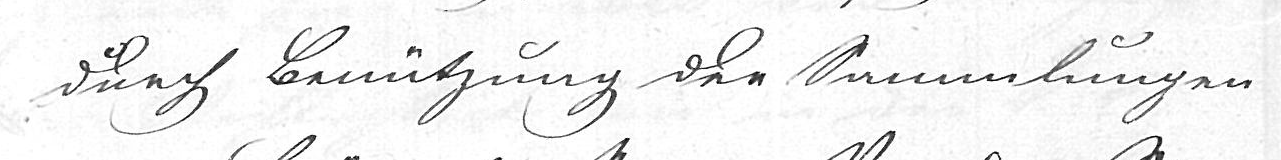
durch Benützung der Sammlungen
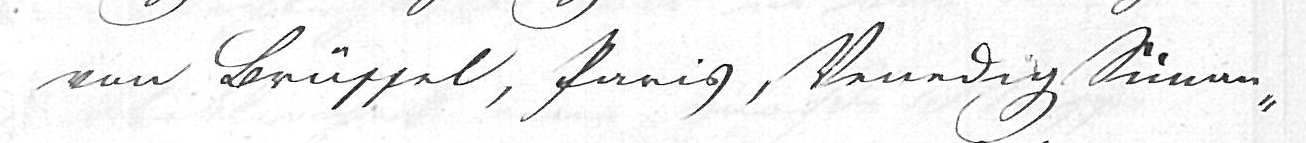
von Brüssel, Paris, Venedig, Siman-
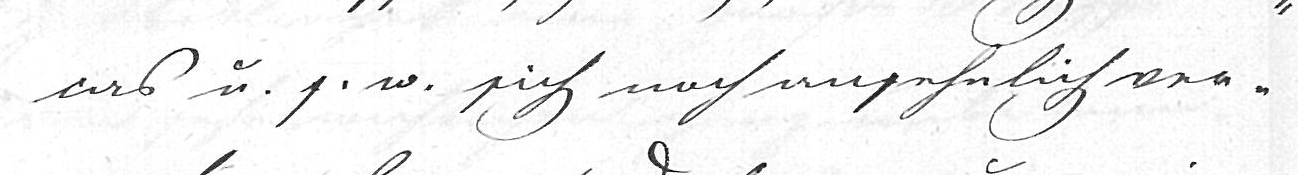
cas u. s. w. sich noch ansehnlich ver-
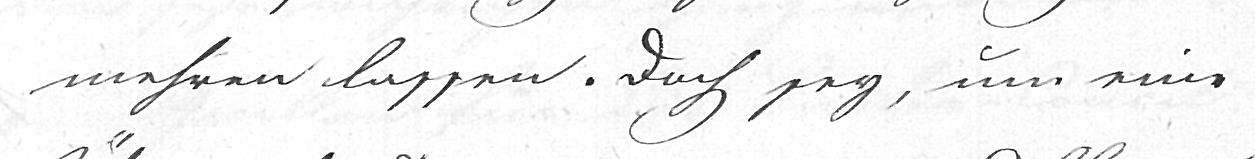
mehren lassen. Doch sey, um eine
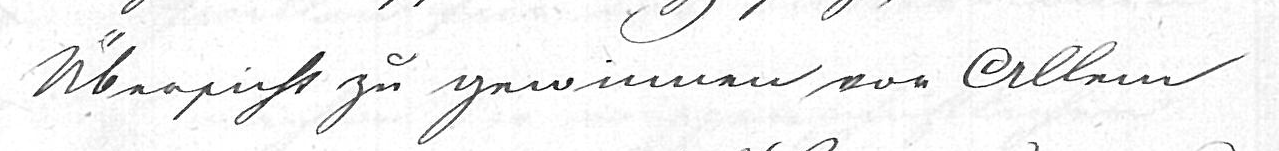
Übersicht zu gewinnen vor Allem
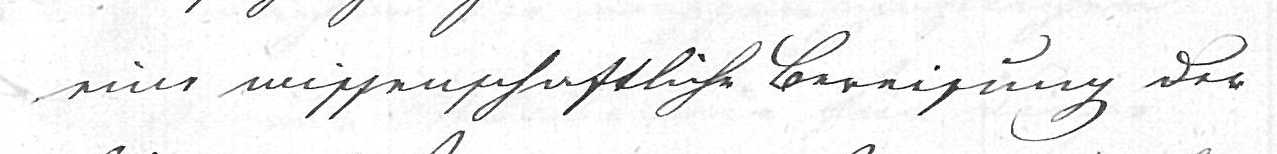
eine wissenschaftliche Bereisung der
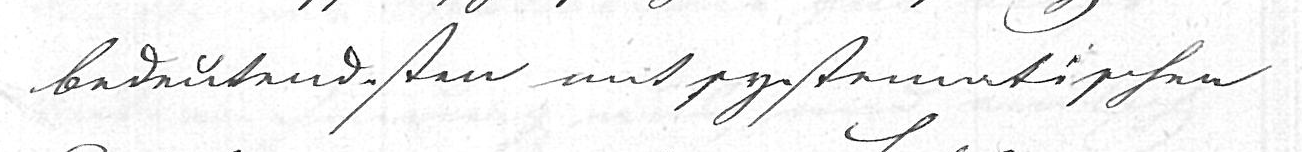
bedeutendsten mit systematischen
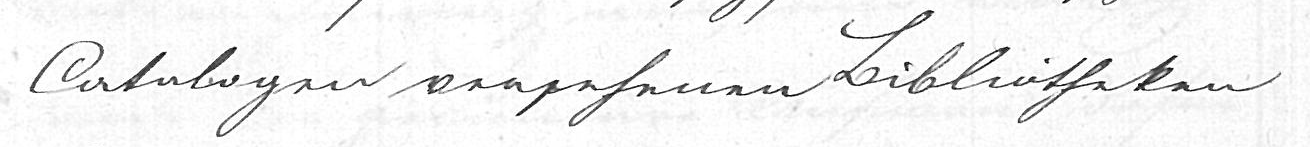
Catalogen versehenen Bibliotheken
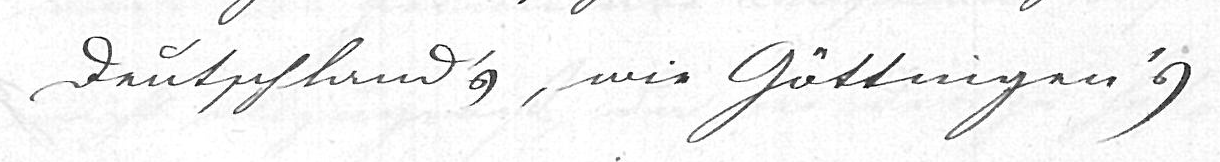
Deutschland's, wie Göttingen's
